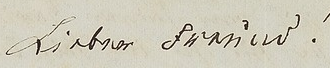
Lieber Freund!
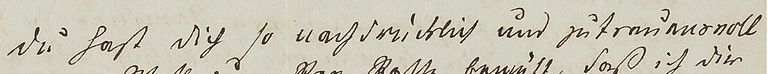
Du hast Dich so nachdrücklich und zutrauensvoll
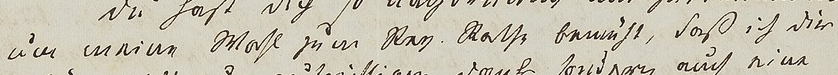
um meine Wahl zum Reg.Rathe bemüht, daß ich Dir
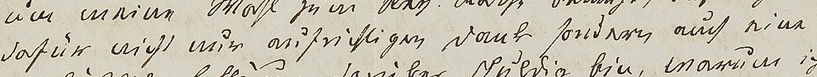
dafür nicht nur aufrichtigen Dank sondern auch eine
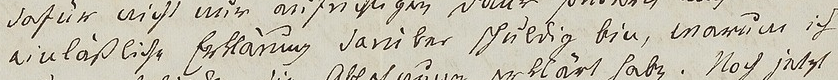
einläßliche Erklärung darüber schuldig bin, warum ich
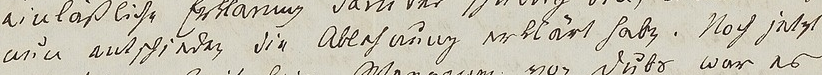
nun entschieden die Ablehnung erklärt habe. Noch jetzt
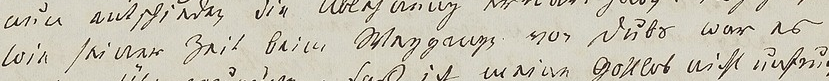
wie seiner Zeit beim Weggange von Dubs war es
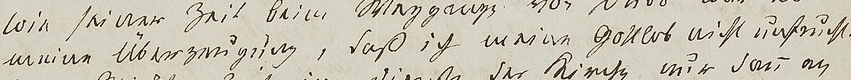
meine Überzeugung, daß ich meine Gottlob nicht unfrucht-
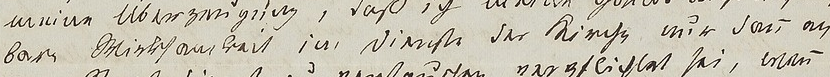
bare Wirksamkeit im Dienste der Kirche nur dann an
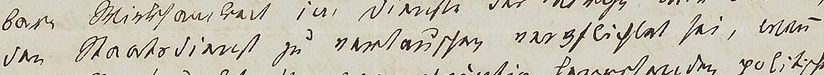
den Staatsdienst zu vertauschen verpflichtet sei, wenn
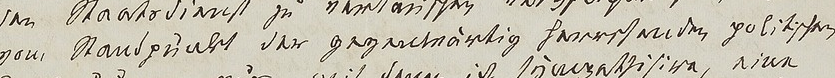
vom Standpunkt der gegenwärtig herrschenden politischen
